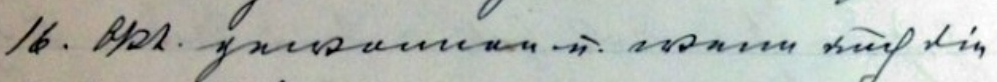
16. Okt. Gewonnen u. war auch die
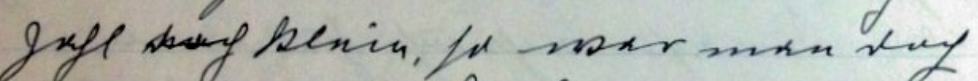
Zahl doch klein, so war man doch
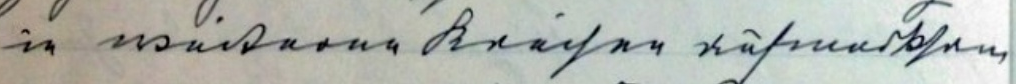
in weiteren Kreisen aufmerksam
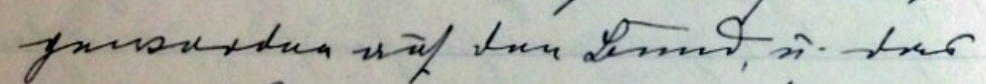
geworden auf den Bund u. das
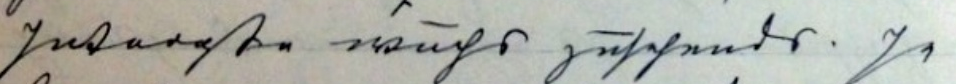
Interesse wuchs zusehends. In
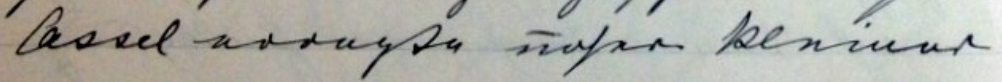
Cassel erregter unser kleiner
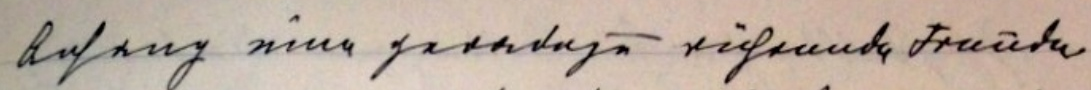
Anfang eine geradezu rührende Freude
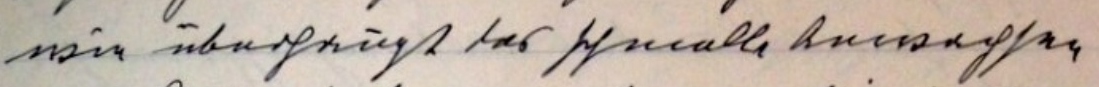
wie überhaupt das schnelle Anwachsen
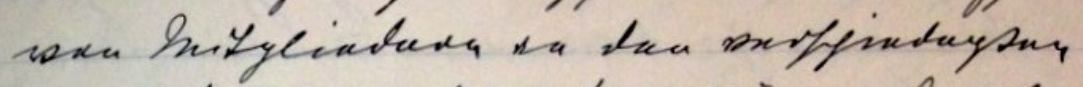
von Mitgliedern an den verschiedenen
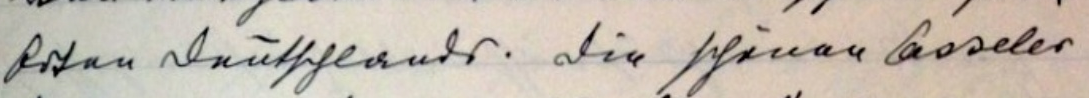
Orten Deutschlands. Die schönen Casseler
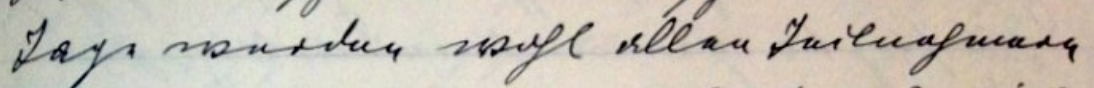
Tage werden wohl allen Teilnehmern
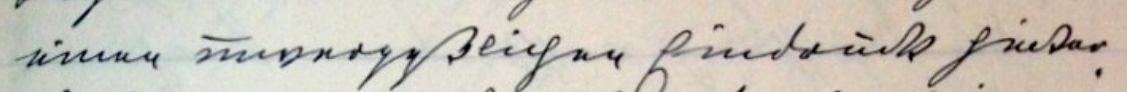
einen unvergesslichen Eindruck hinter
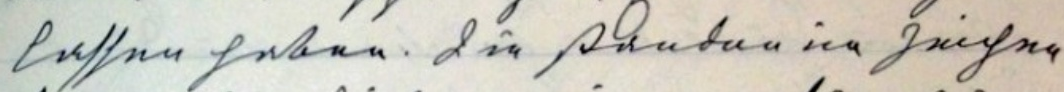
lassen haben. Sie standen im Zeichen
